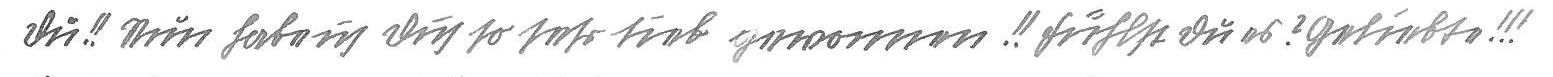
Du!! Nun habe ich Dich so sehr lieb gewonnen!! Fühlst Du es? Geliebte!!!
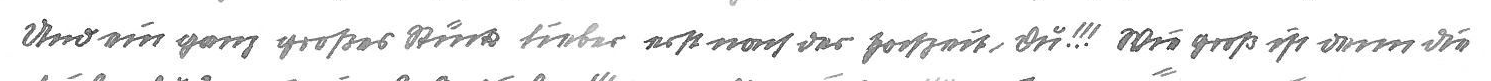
Und ein ganz großes Stück lieber erst nach der Hochzeit, Du!!! Wie groß ist denn die
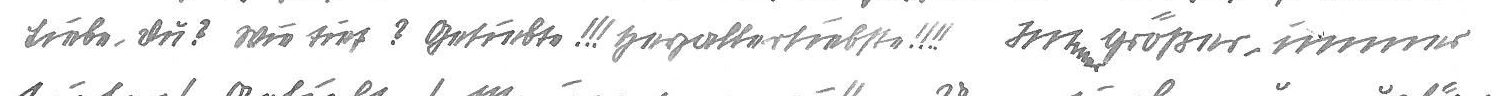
Liebe, Du? Wie tief? Geliebte!!! Herzallerliebste!!!! Immer größer, immer
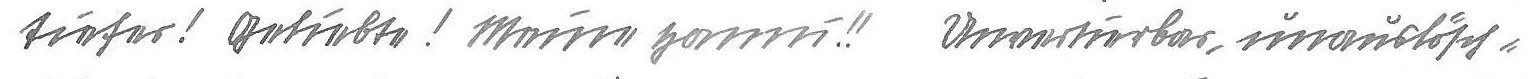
tiefer! Geliebte! Meine !! Unverlierbar, unauslösch¬
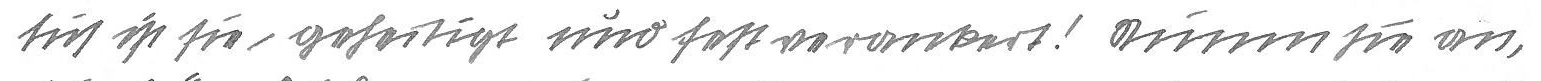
lich ist sie, geheiligt und fest verankert! Nimm sie an,
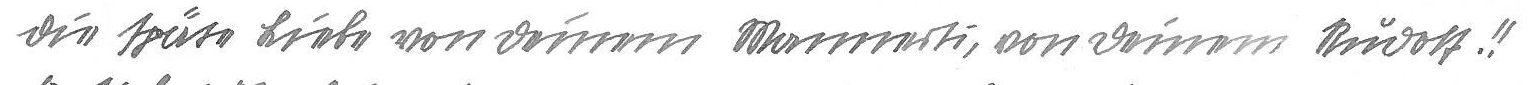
die späte Liebe von Deinem Mannerli, von Deinem !!
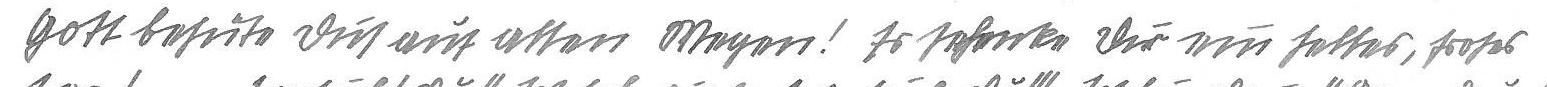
Gott behüte Dich auf allen Wegen! Er schenke dir ein festes, frohes
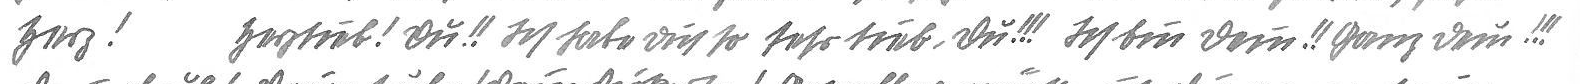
Herz! Herzlieb! Du!! Ich habe Dich so sehr lieb, Du!!! Ich bin Dein! Ganz Dein!!!
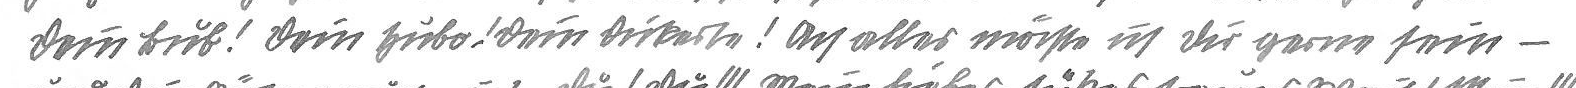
Dein Bub! Dein Hubo! Dein Dickerle! Ach alles möchte ich Dir gerne sein –
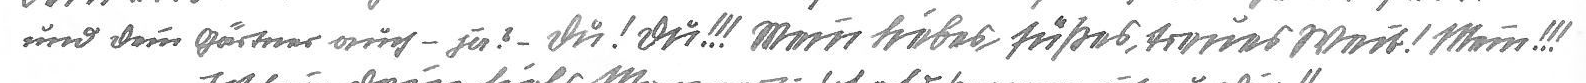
und Dein Gärtner auch – ja? – Du! Du!!! Mein liebes, süßes, treues Weib! Mein!!!
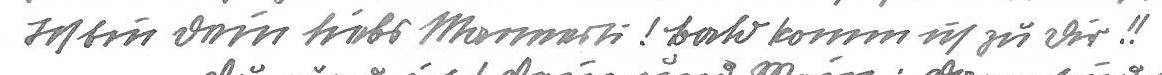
Ich bin Dein liebs Mannerli! Bald komm ich zu Dir!!
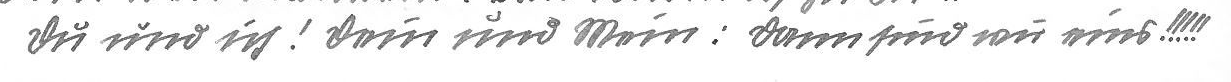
Du und ich! Dein und Mein: Dann sind wir eins!!!!!
